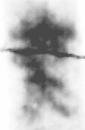黃
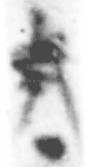○（夏）
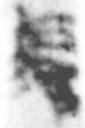馭（御）
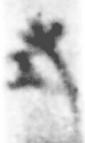○（右）
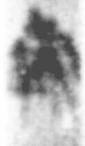○（旆）
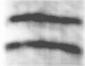二
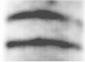二
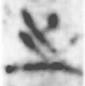之
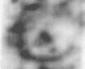屯
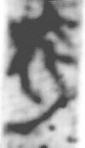狐
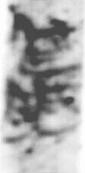聶（攝）
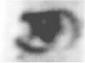四
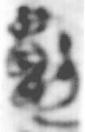○（貂）
